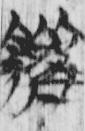觀
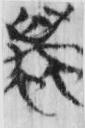蠆
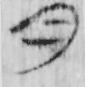月
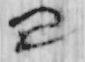己
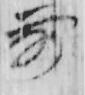亥
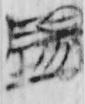○（陽）
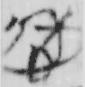恘
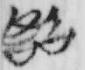臨
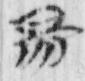昜（陽）
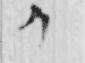人
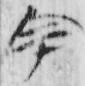主
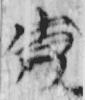賈
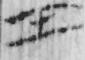壬
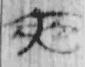寅
